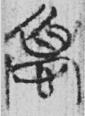○（隕）
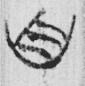自
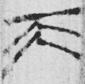天
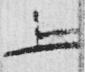上
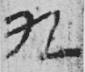九
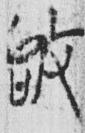敂
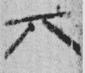亓（其）
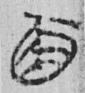角
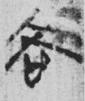吝
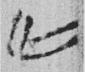亡
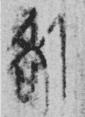咎
